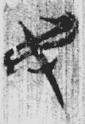民
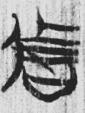者
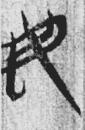母
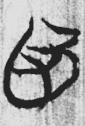㘝（攝）
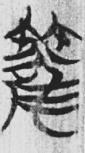{竹雀}（爵）
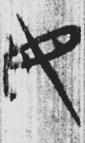母
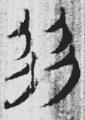○（御）
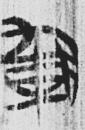軍
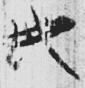母
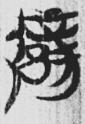辟（避）
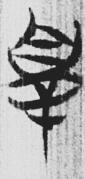辠
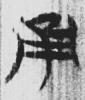甬（用）
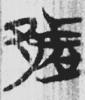都
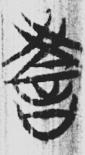○（教）
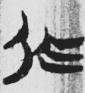於
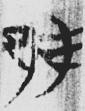邦
